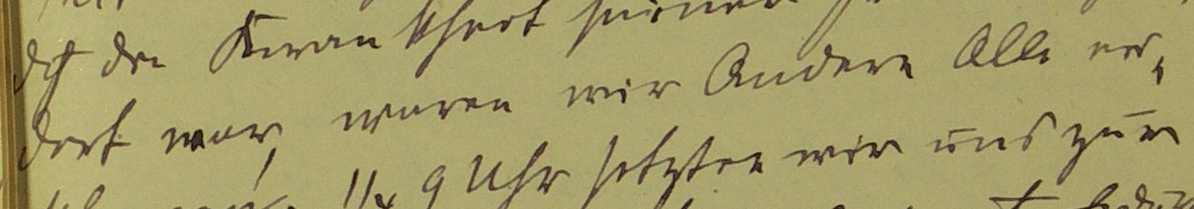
dert war, waren wir Anderen alle er¬
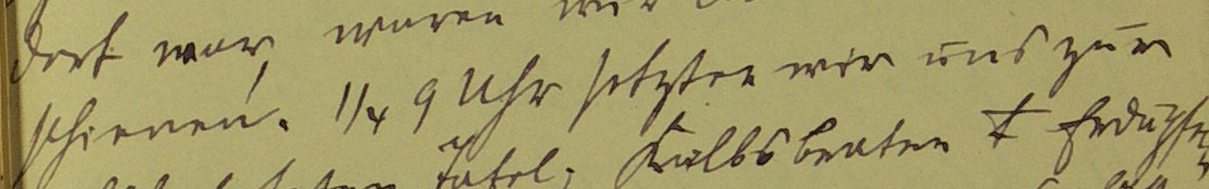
schienen. ¼ 9 Uhr setzten wir uns zur
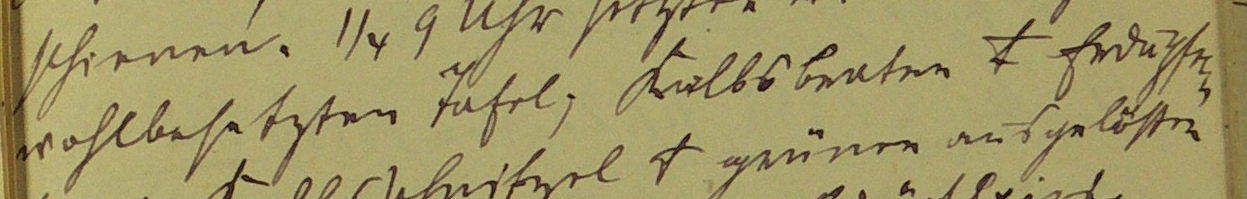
wohlbesetzten Tafel, Kalbsbraten mit Erdäpfel¬
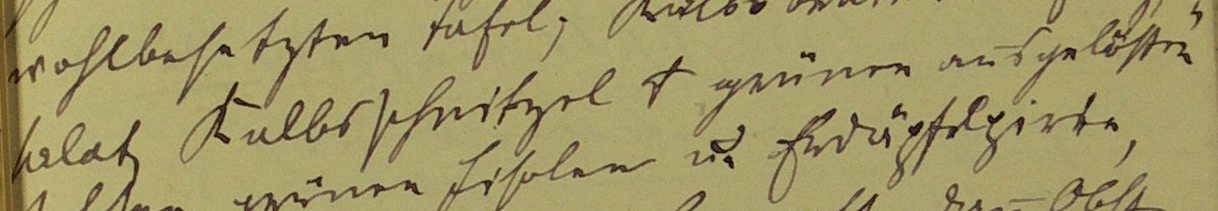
salat, Kalbsschnitzel mit grünen ausgelösten
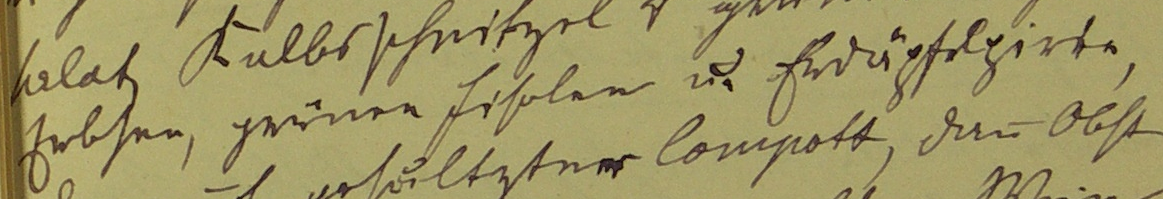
Erbsen, grünen Fisolen und Erdäpfelpiree,
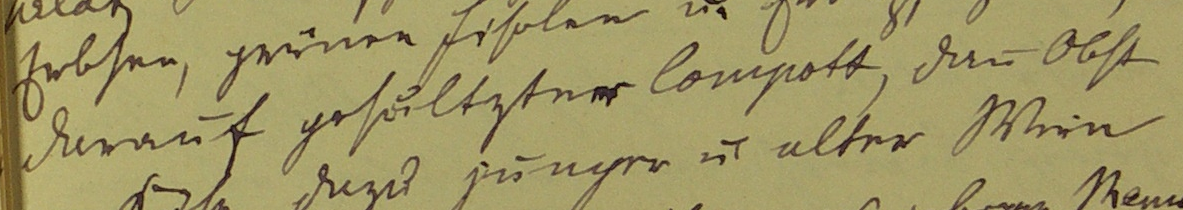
darauf gesaltzter Compott , dann Obst
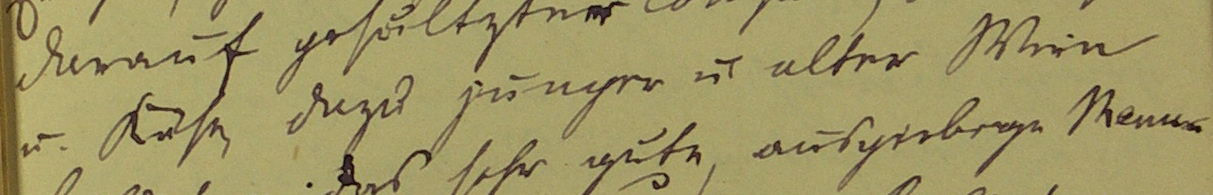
und Käs, dazu junger und alter Wein
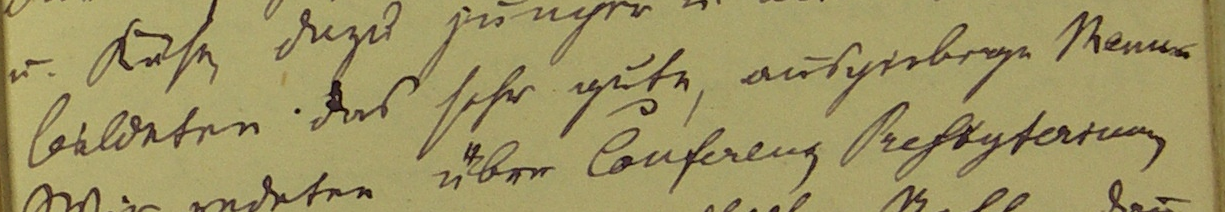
bildeten das sehr gute , ausgiebige Menu .
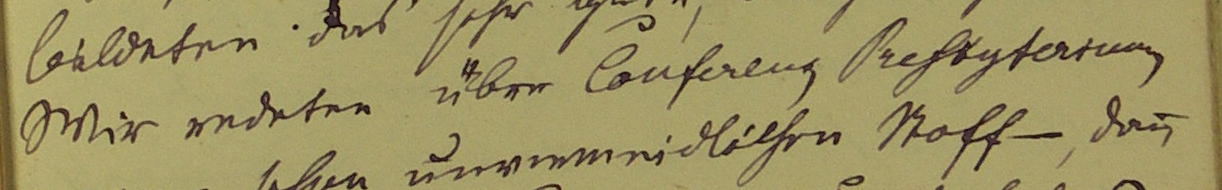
Wir redeten über Conferenz Presbytherium
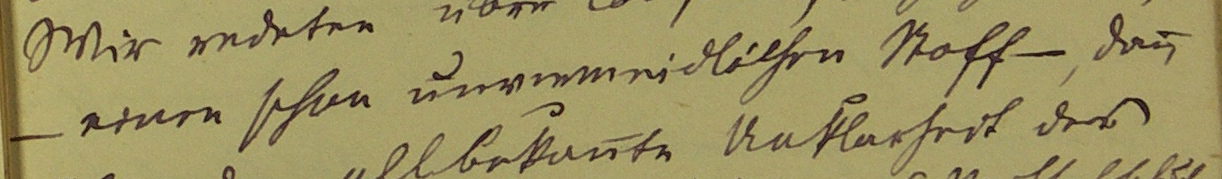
- einen unvermeidlichen Stoff, - dann
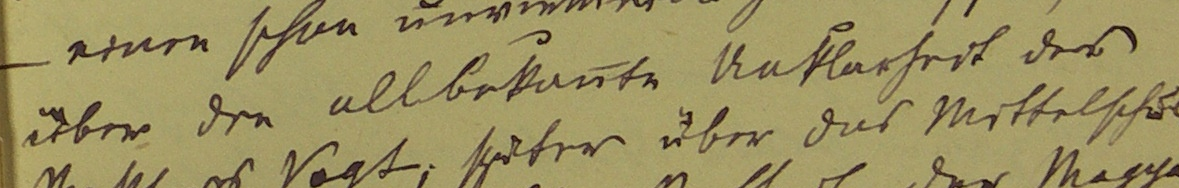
über die allbekannte Unklarheit des
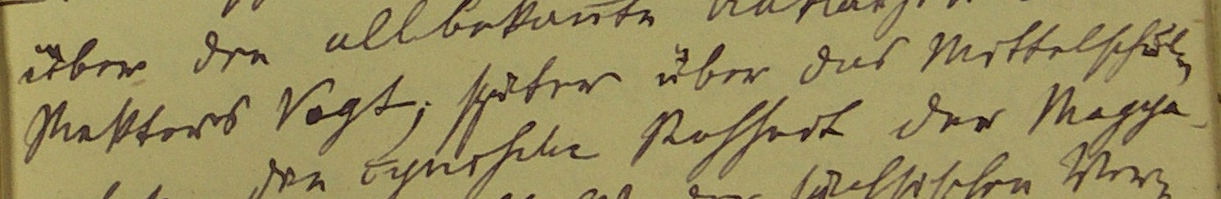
Rektors Vogt, später über das Mittelschul¬
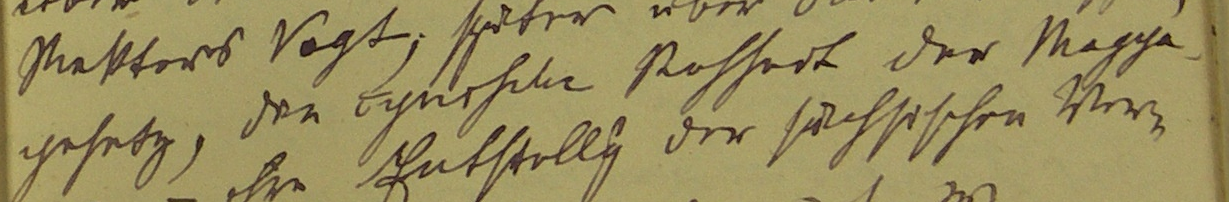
gesetzte, die zynische Rohheit der Magy¬
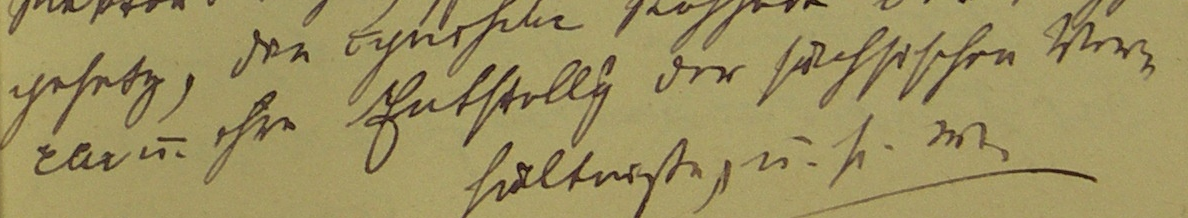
aren und ihre Einstellung der sächsischen Ver¬
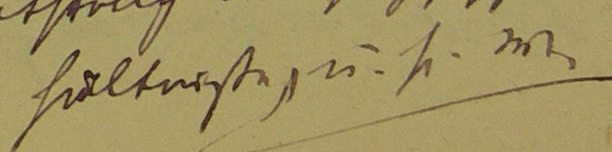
hältnisse u.s.w.
